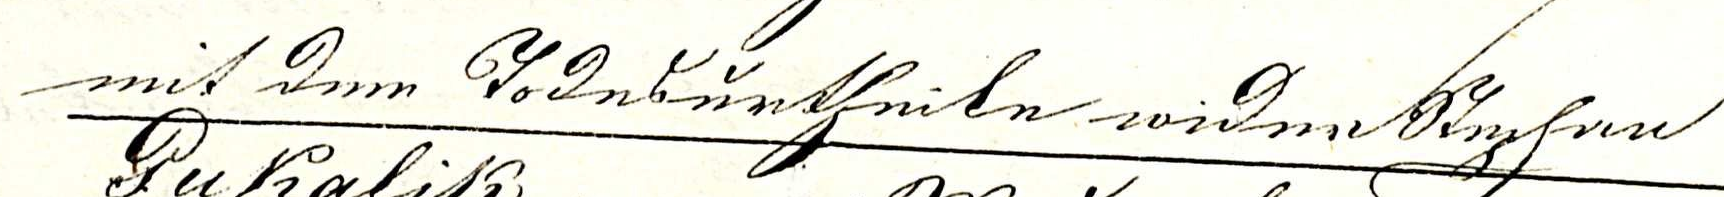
mit dem Todesurtheile wider Stephan
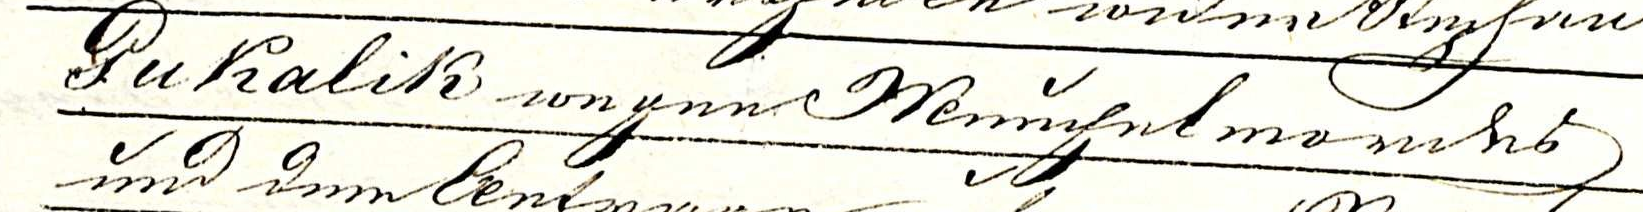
Pukalik wegen Meuchelmordes
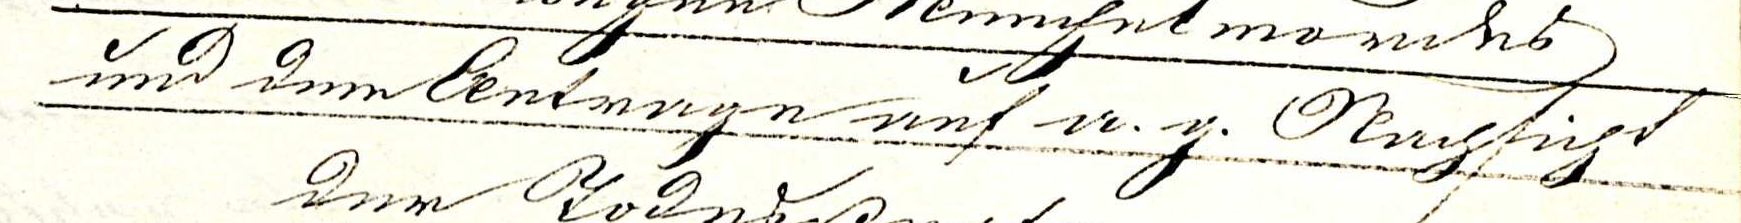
und dem Antrage auf a. g. Nachsicht
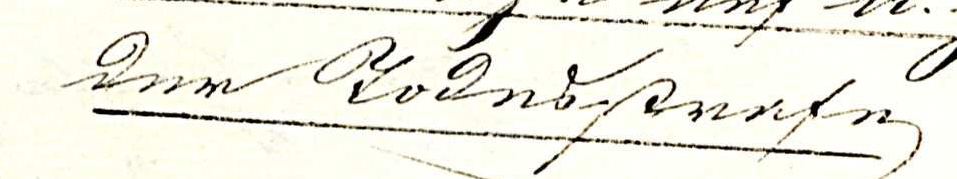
der Todesstrafe
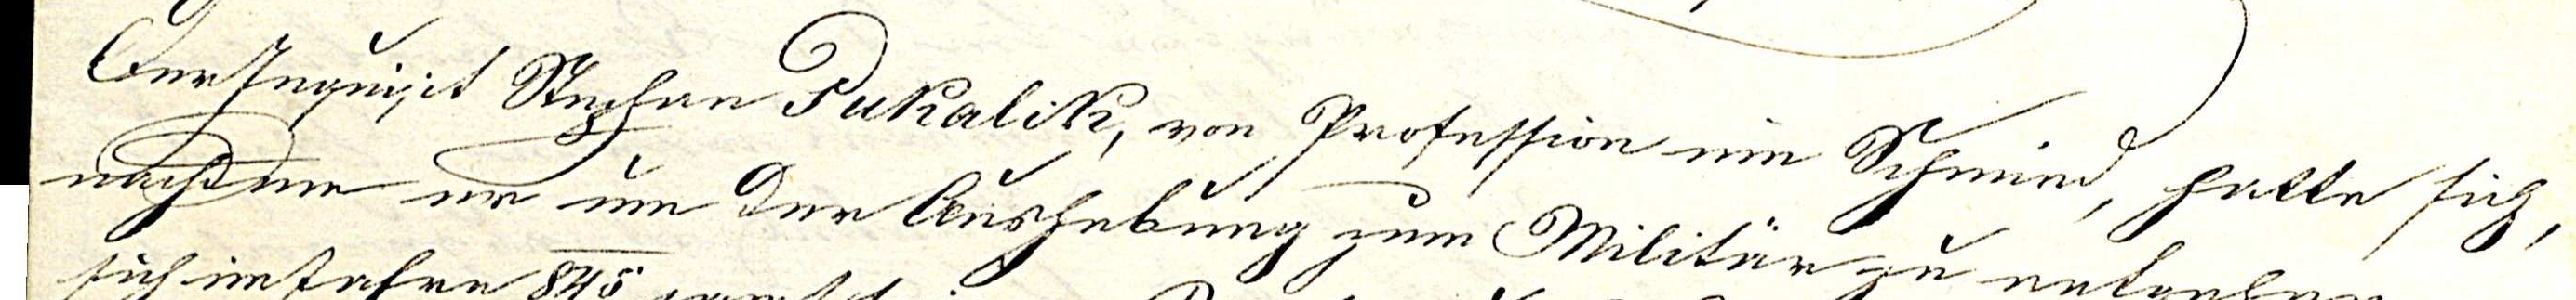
Der Jnquisit Stephan Pukalik, von Profession ein Schmied, hatte sich,
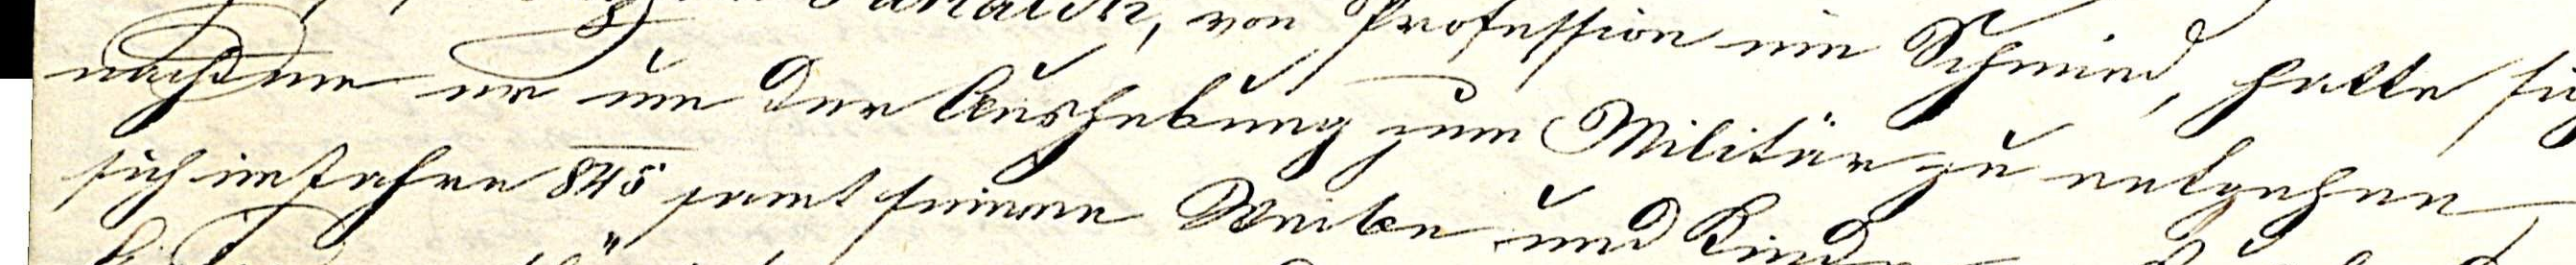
nach dem xx um der Aushebung zum Militär zu entgehen,
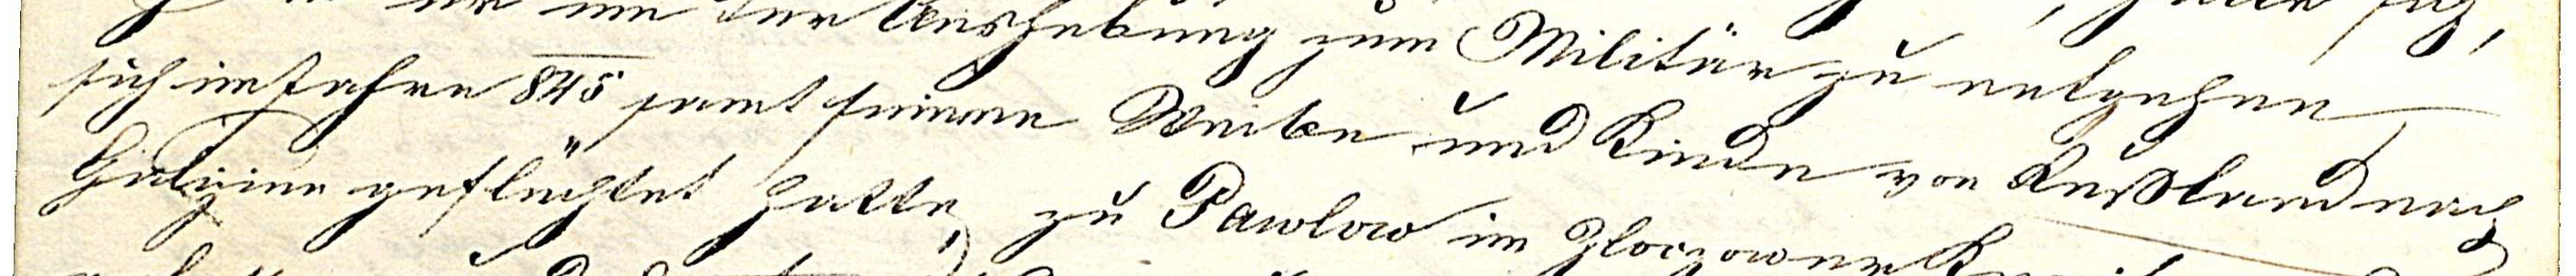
sich im Jahre 845 samt seinem Weibe und Kinde von Rußland nach
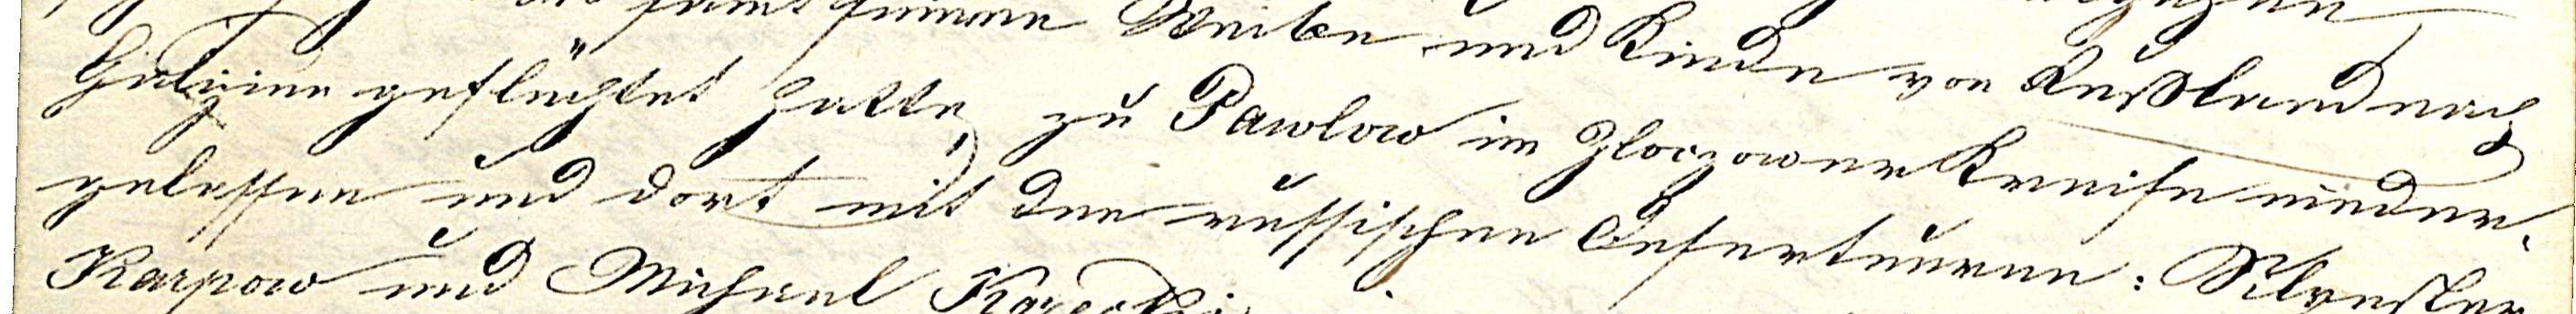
Gaxx geflüchtet hatte, zu Pawlow im xx Kreise nieder¬
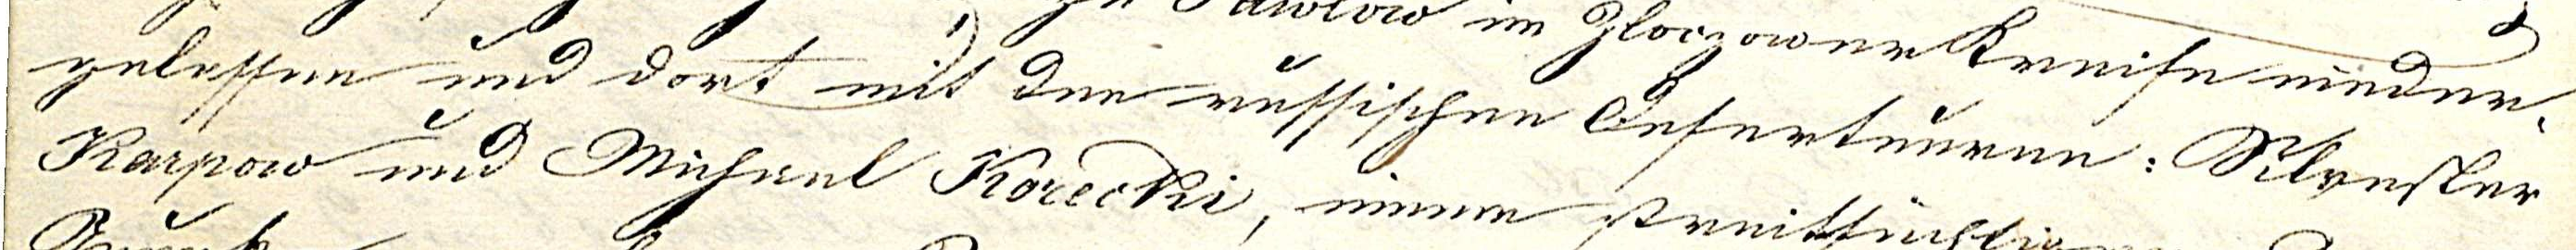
gelassen und dort mit den russischen Deserteuren: Kloester
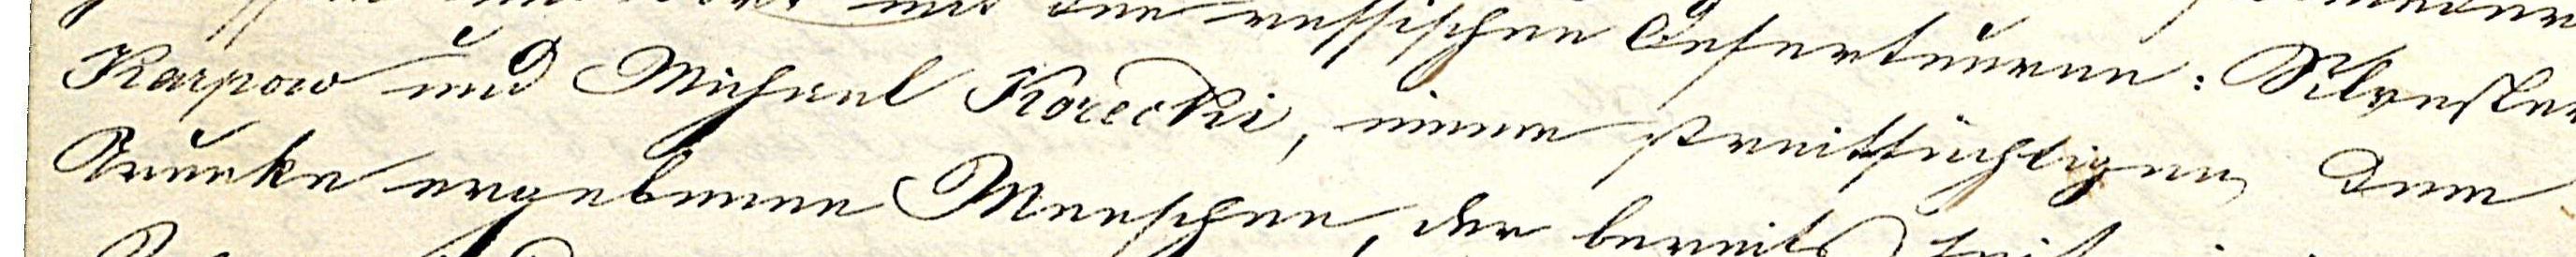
Karpow und Michael Korecki, einem streitsüchtigen dem
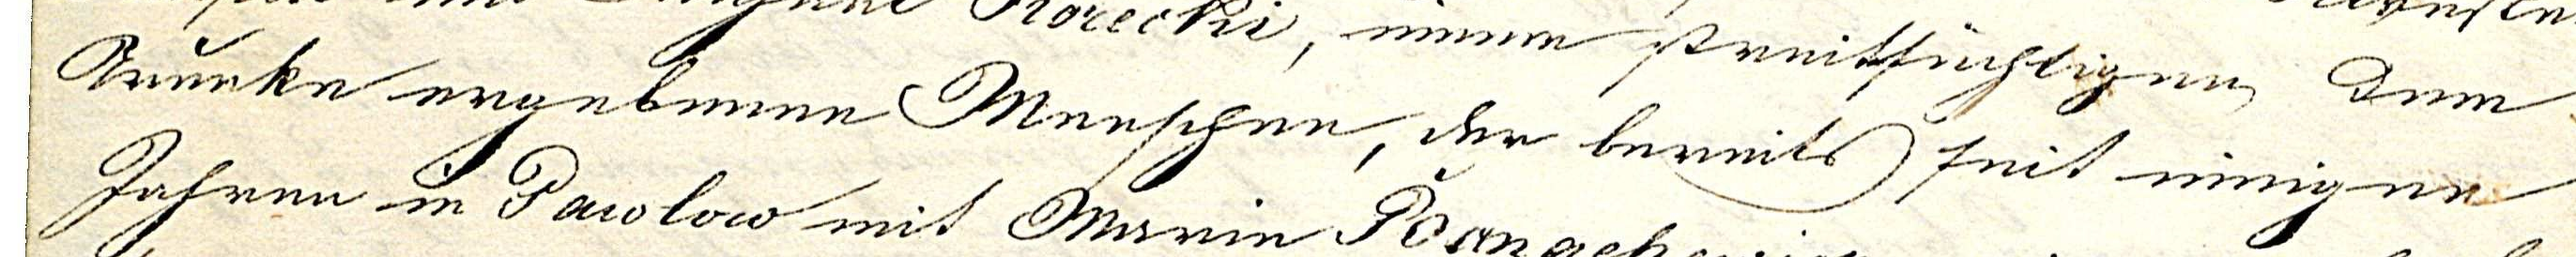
xx ergebenen Menschen, der bereits seit einigen
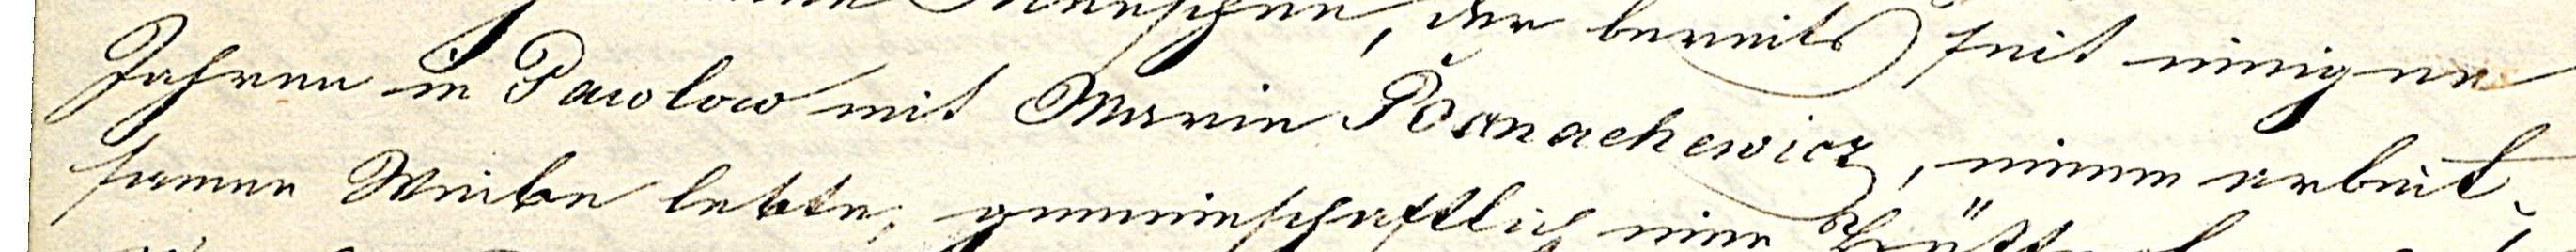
Jahren in Pawlow mit Marie Posmachewicz, einem arbeit¬
